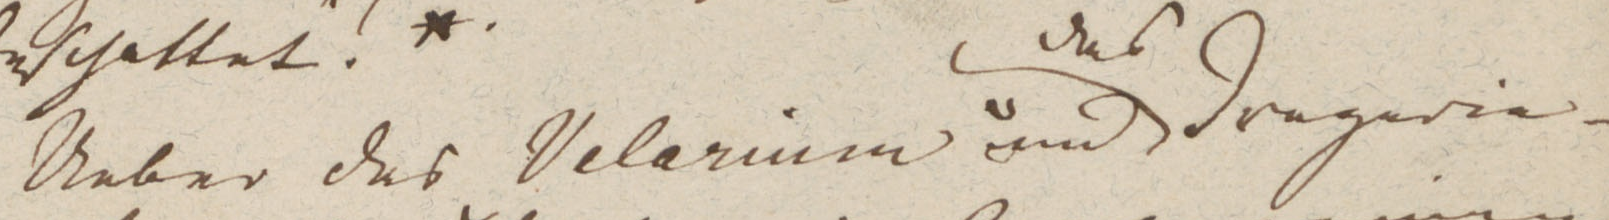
Ueber das Velarium und das Draperie-
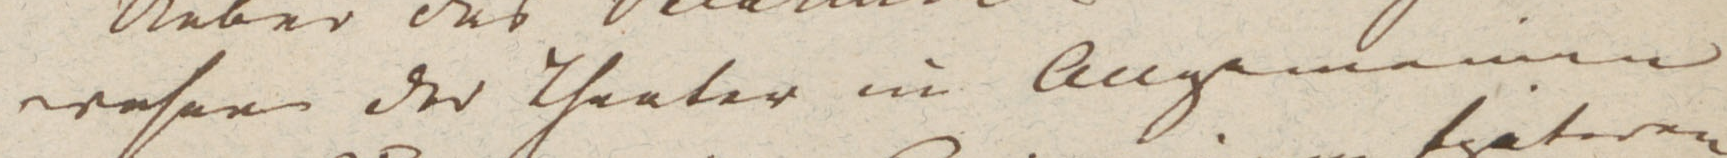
wesen der Theater im Allgemeinen
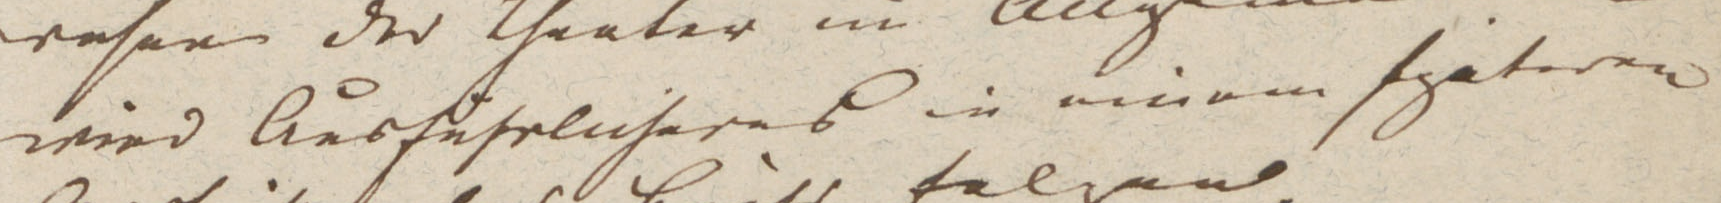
wird Ausführlicheres in einem späteren
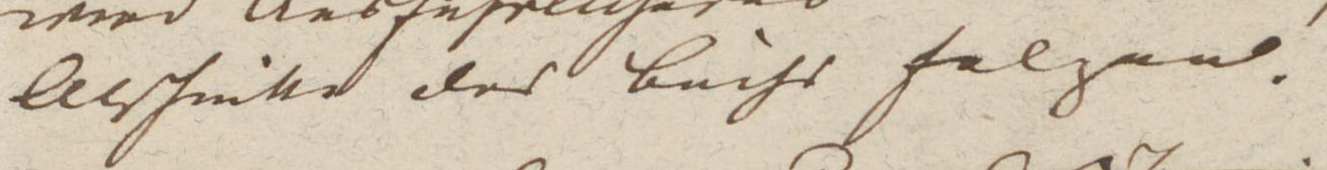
Abschnitte des Buchs folgen.
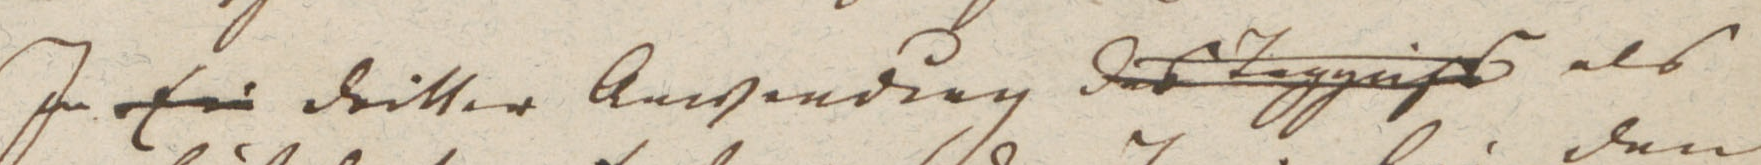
In Ein dritter Anwendung des Teppichs als
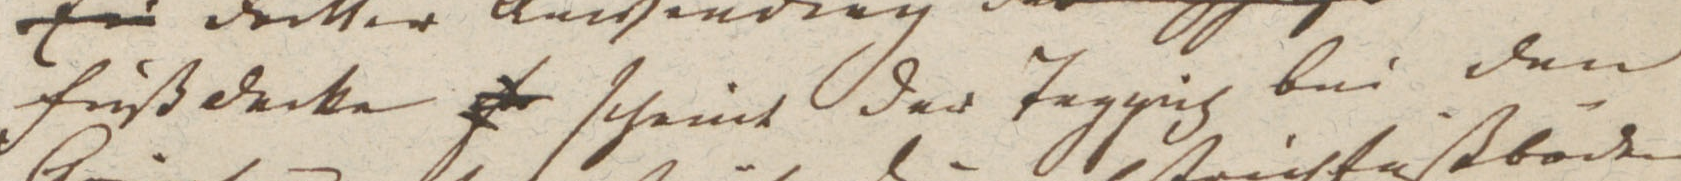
Fussdecke f scheint der Teppich bei den
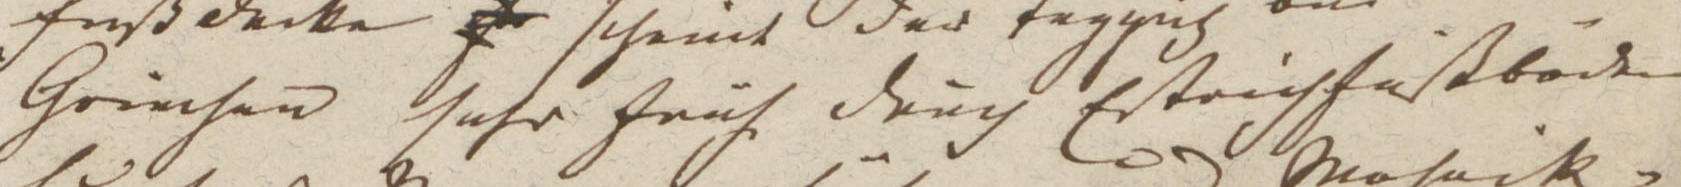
Griechen sehr früh durch Estrichfussböden
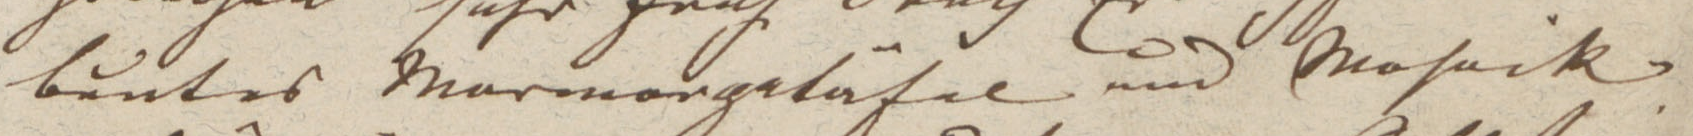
buntes Marmorgetäfel und Mosaik
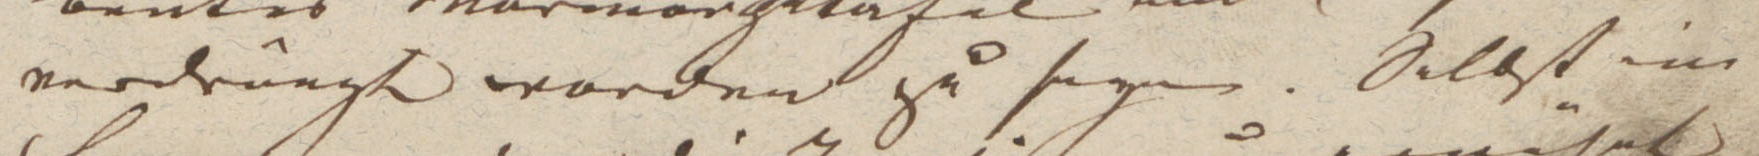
verdrängt worden zu seyn. Selbst im
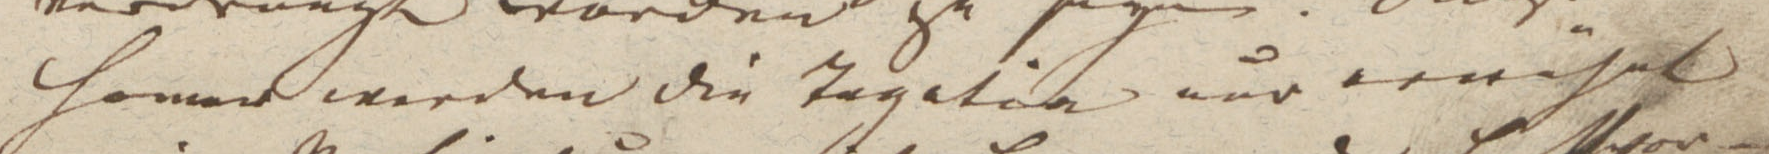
Homer werden die Tapetia nur erwähnt
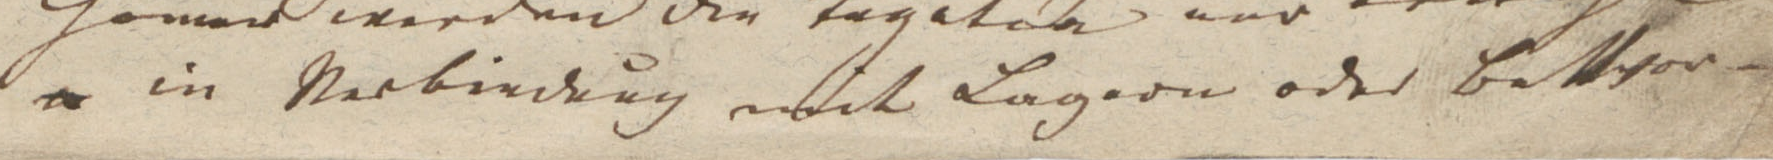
in Verbindung mit Lagern oder Bettvor-
